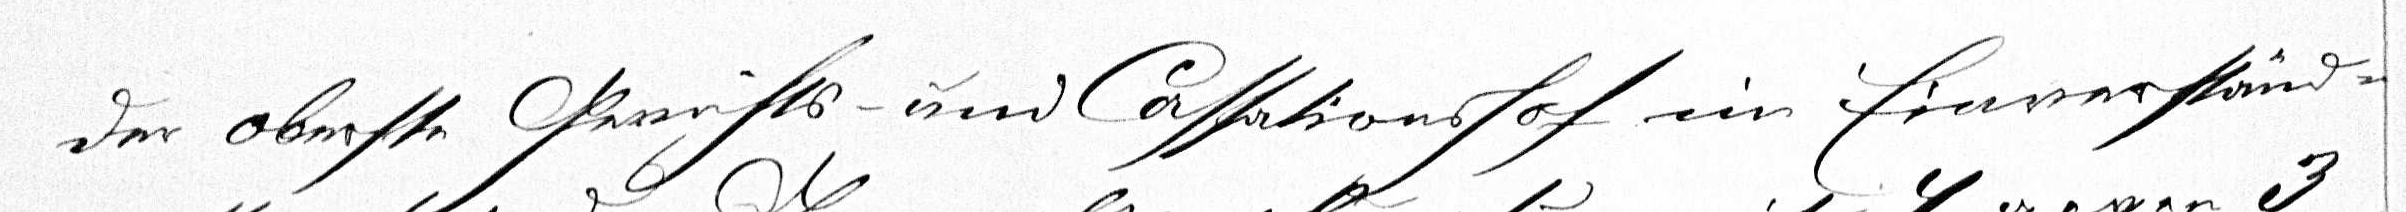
der oberste Gerichts- und Cassationshof im Einverständ¬
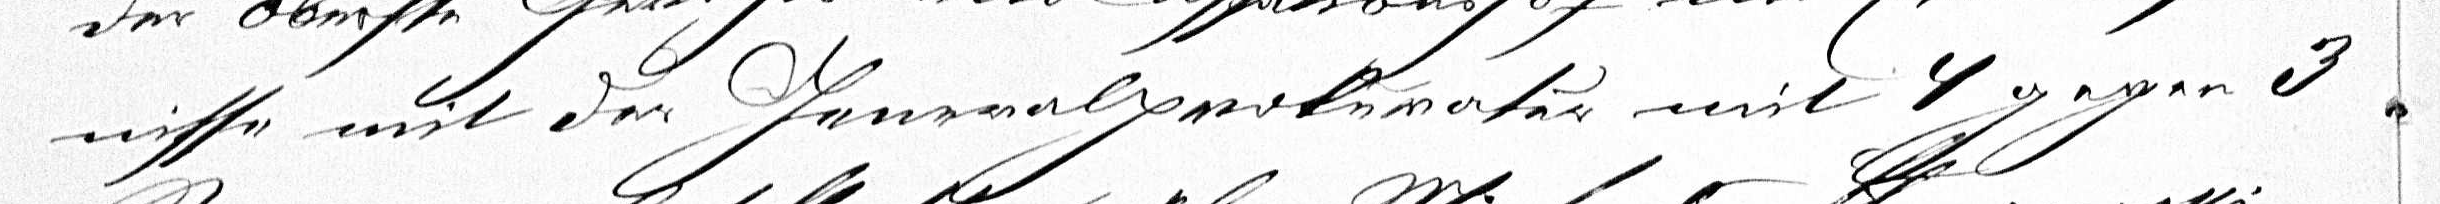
nisse mit der Generalprokuratur mit 4 gegen 3
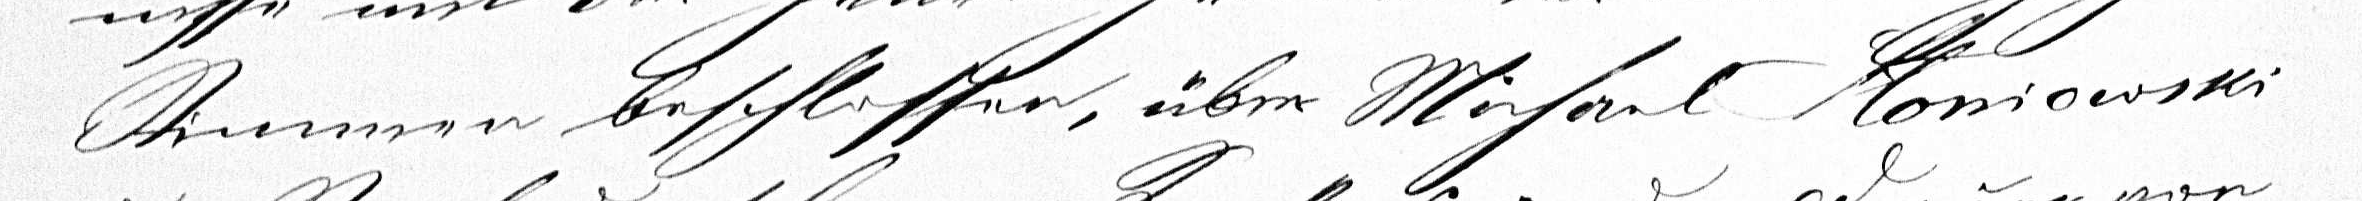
Stimmen beschlossen, über Michael Stoniowski
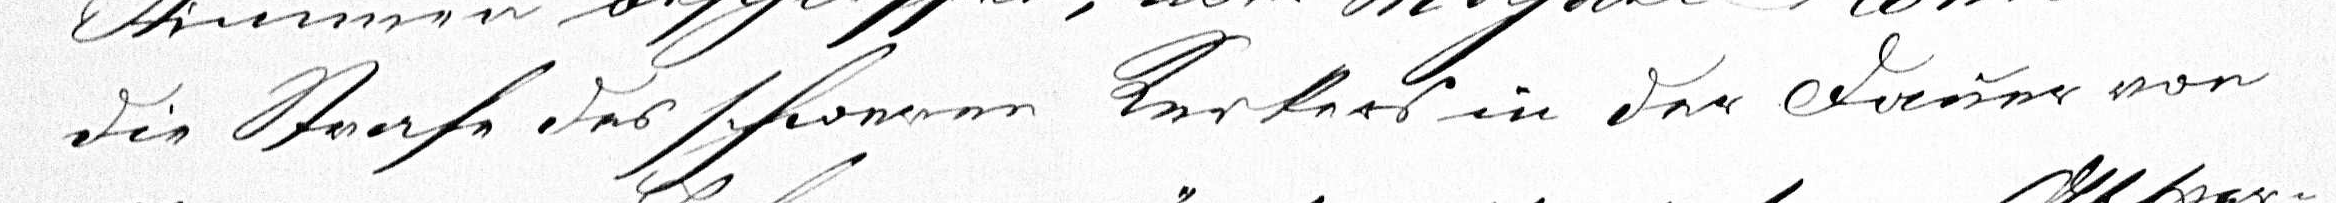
die Strafe des schweren Kerkers in der Dauer von
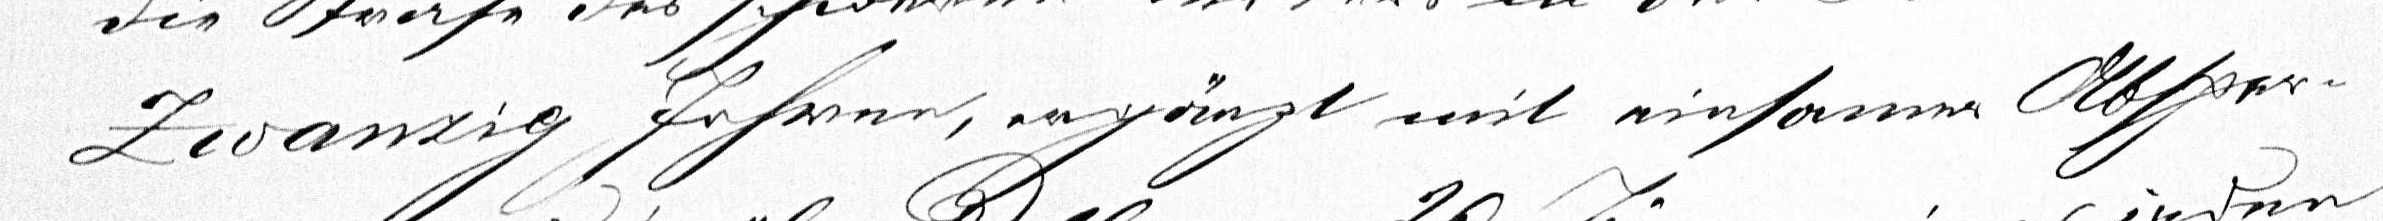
Zwanzig Jahren, ergänzt mit einsamer Absper¬
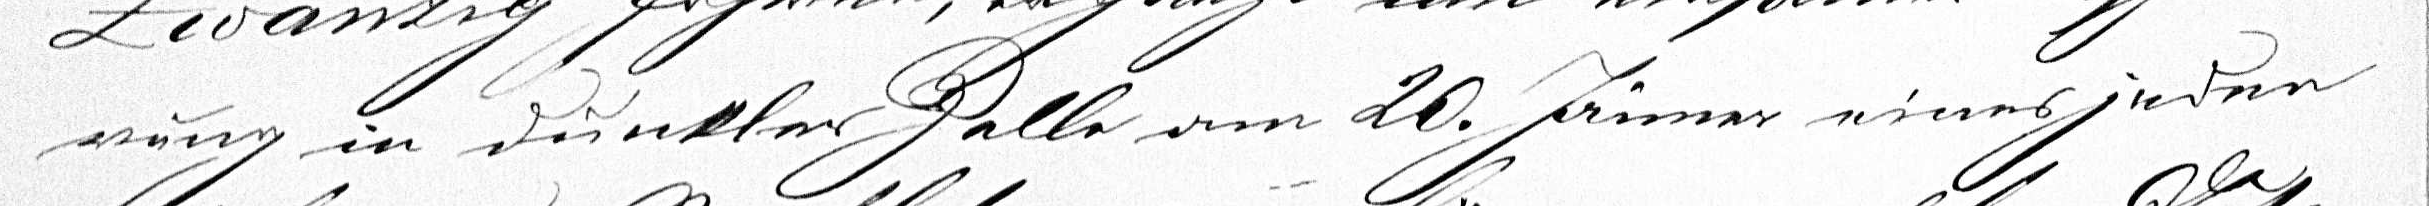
rung in dunkler Zelle am 20. Jaimer eines jeden
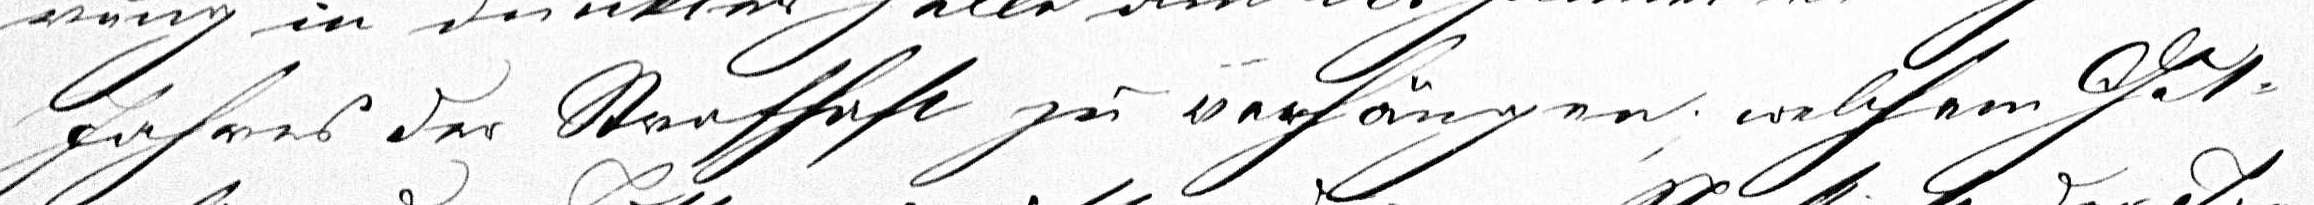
Jahres der Strafhast zu verhängen; welchem Gut¬
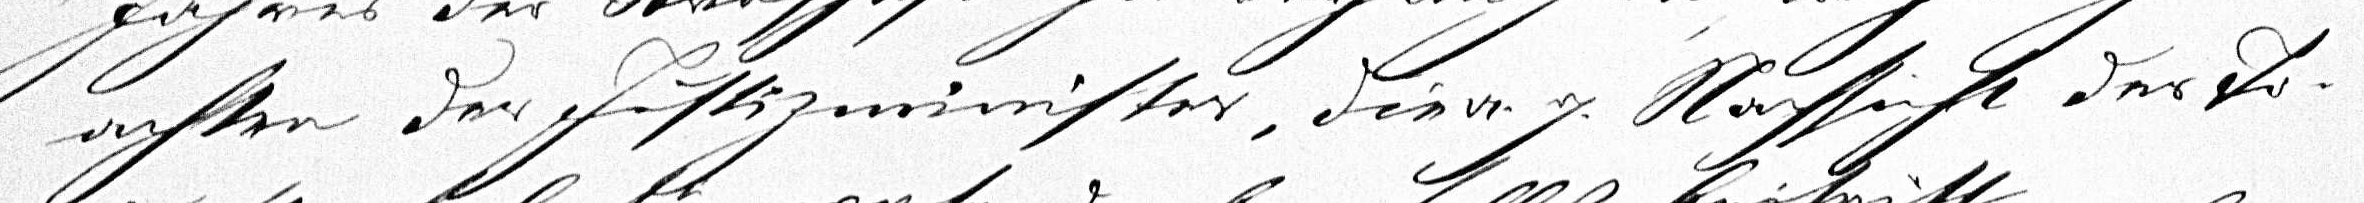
achten der Justizminister, die a. g. Nachsicht der To¬
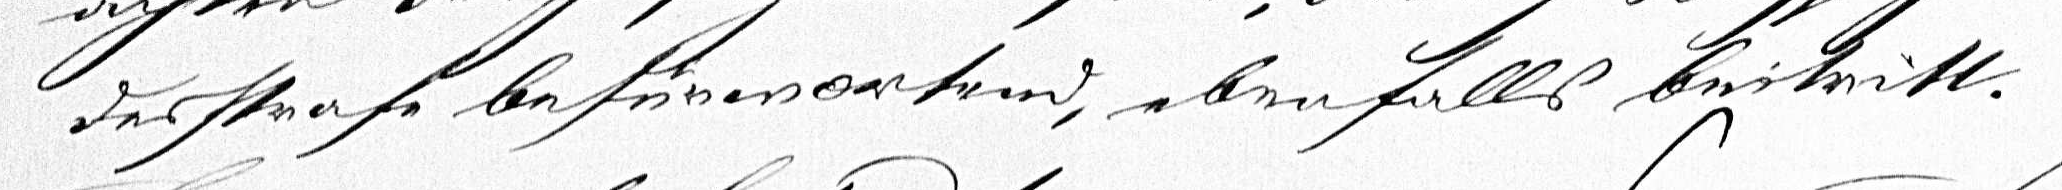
desstrafe befürwortend, ebenfalls beitritt.
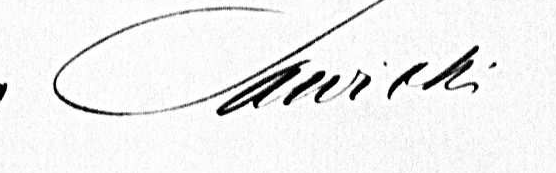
Sawicki
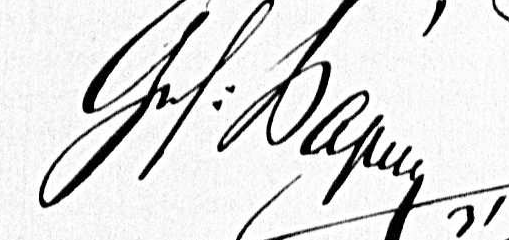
Ges: xx
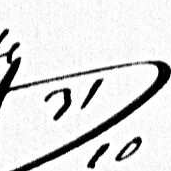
31
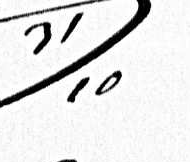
10
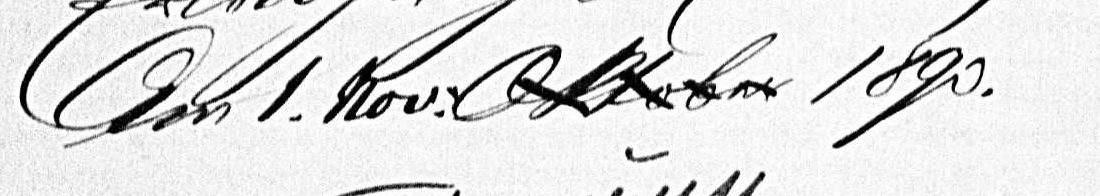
Am 1. Nov. 1890
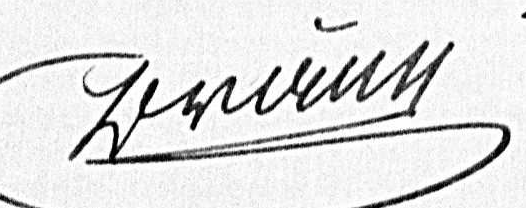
Braun
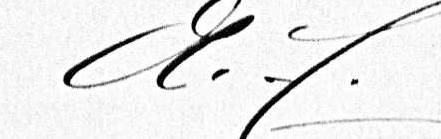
A. E.
